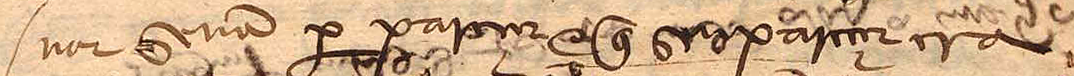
nar senā ꝑ pareçer e q̄ seu pareçer era
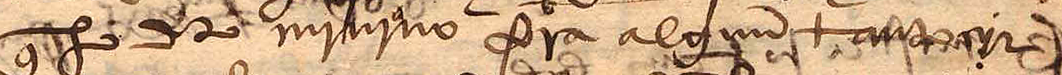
q̄ ho dito mjnjno fora alguū tanto cyr
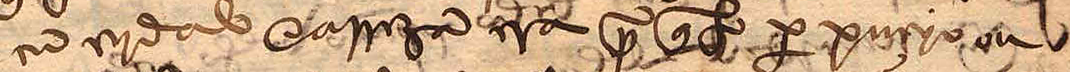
cūcydado e a rrezā era p̄oq̄ ho ꝑpuçyo ou
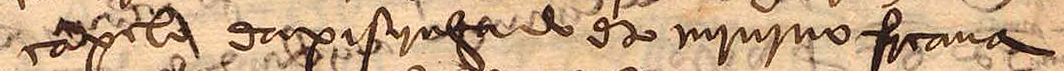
capelo da pisynha do dto mjnjno fjcaua
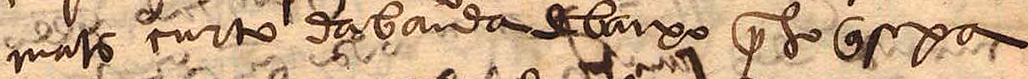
majs curto da banda de baixo p̄ ho q̄ se pa
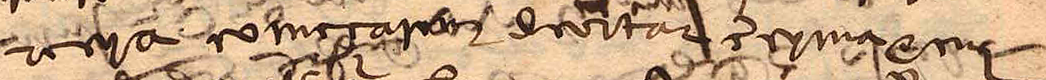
recya começarem de cortar ē cyma e em
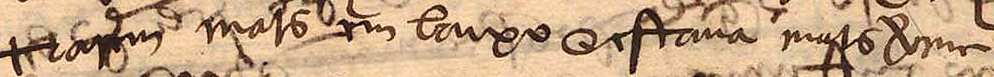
trarem majs em baixo e estaua majs ꝟme
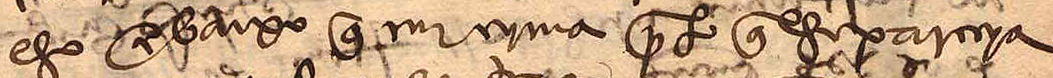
lho ē baixo q̄ em cyma p̄ ho q̄ lhe parecya
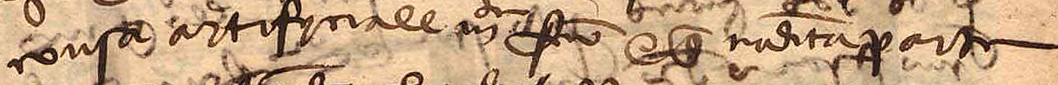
cousa artifyciallmte fc̄o e q̄ na dita parte
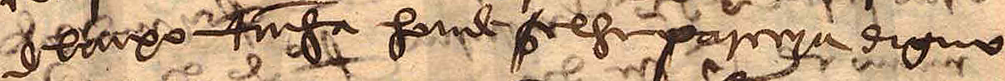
de baixo tinha honde se lhe parecya diguo
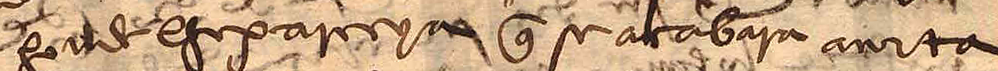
honde lhe parecya q̄ se acabara a corta
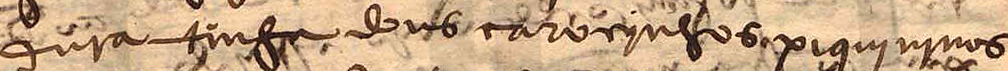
dura tinha dous carocynhos piqujnjnos
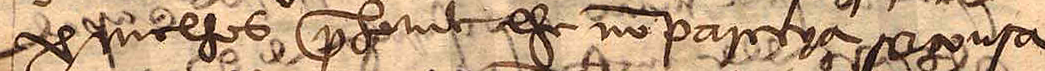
ꝟmelhos p̄ honde lhe nō parecya ser cousa
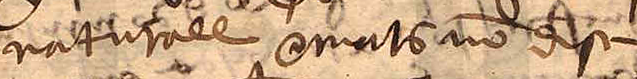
naturall e majs nō dise
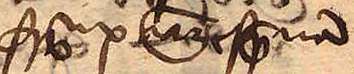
frrco pāaz sp̄uā
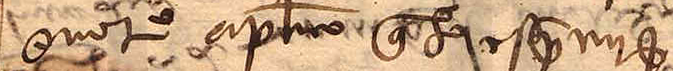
e noto ap̄lico q̄ ho esp̄uy
